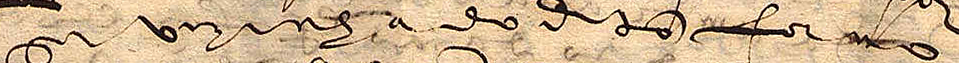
ser vizinha do dito forno
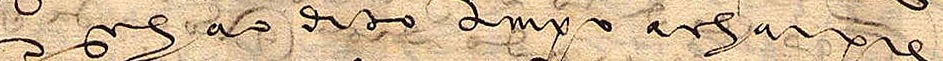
e se hao dito tempo achar pre
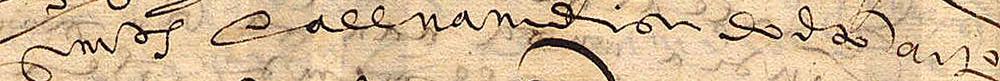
semte e all nam dise do dito arto
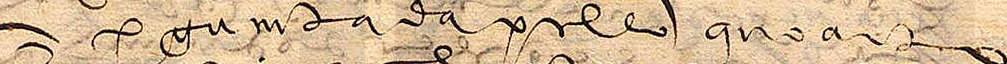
item ꝑgumtada pello quoarto
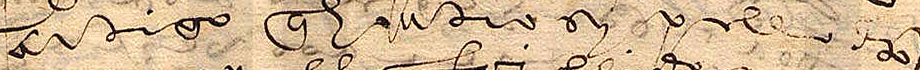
artigo q̄ houtrosy pello dtō
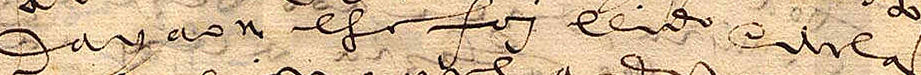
dayaom lhe foj llido e decla
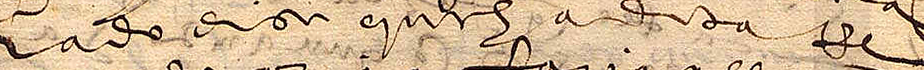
rado dise que ha dita Re
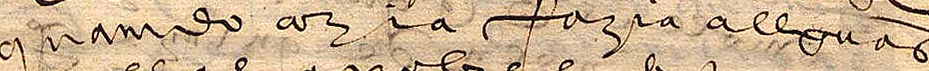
quamdo cozia fazia allguās
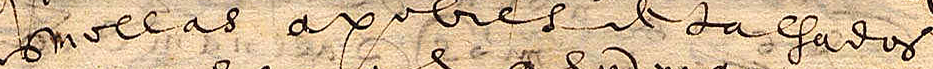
esmollas a pobres de talhadas
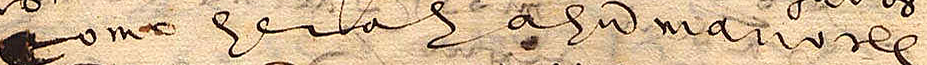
como hera ha hū manoell
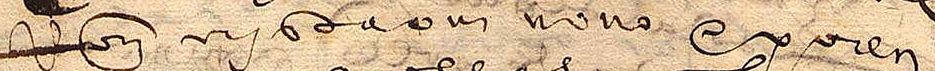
Rōiz crjstaom nouo e porem
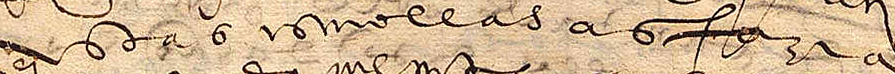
q̄ estas esmollas as fazia
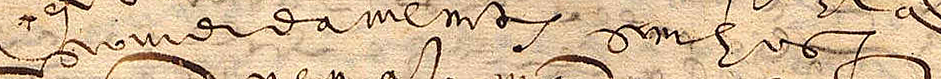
escomdidamemtꝭ sem hos Jr
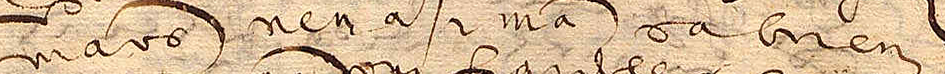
maõs nem a Jrmā saberem
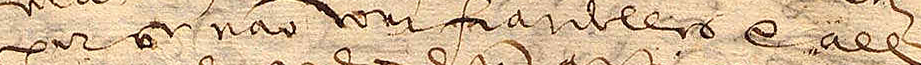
por se não confiar delles e all
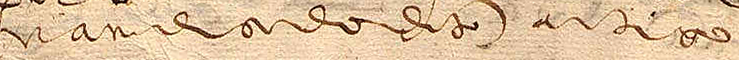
nam dise do dito artigo
